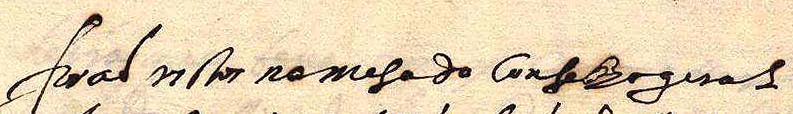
foraõ vistos na mesa do Conselho geral
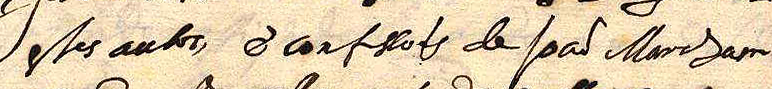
estes autos, e confissoẽs de Joaõ Marcham
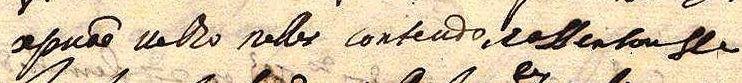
xpuão uelho nelles conteudo, e assentousse
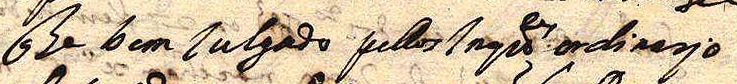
q̄ he bem Iulgado pellos Inqures ordinarjo
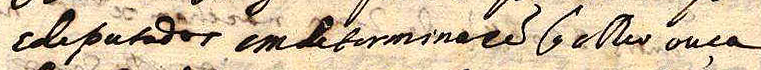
E deputados em determinarē q̄ o Reo ouça
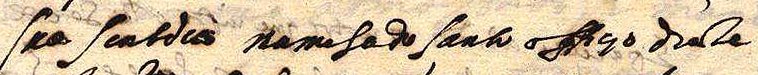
sua sentēça na mesa do santo officjo diāte
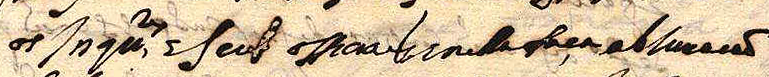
os Jnqures, E seus officiais E nella faça abIuraçaõ
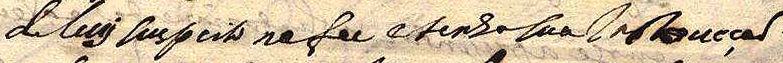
de leuj suspeito na fee e tenha sua Instrucçaõ
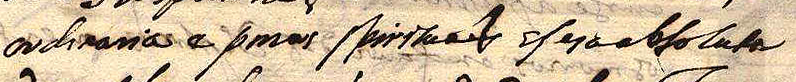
ordinaria e penas spirituaes E seja absoluta
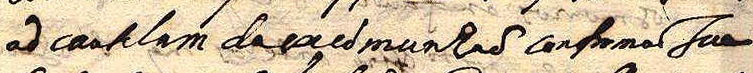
ad cautelam da excōmunhaõ confirmaõ sua
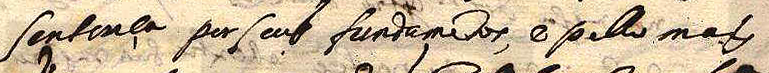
Sentença por seus fundamētos, e pello mais
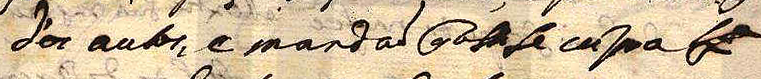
dos autos, e mandaõ q̄ assi se cūpra lxa
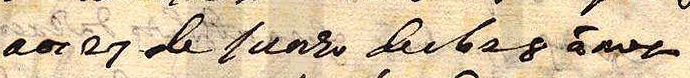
aos 27 de Iunho de 1628 ānos
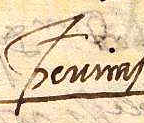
G. pereira
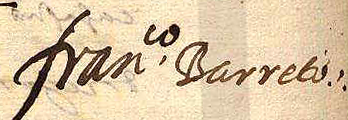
fran.co Barreto
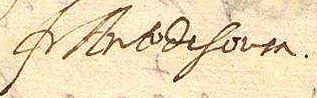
fr Anto de sousa
